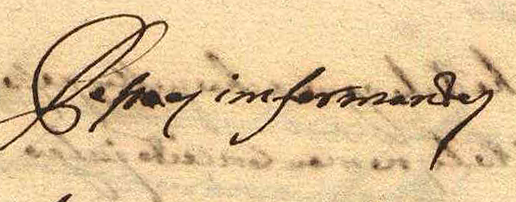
Pessoas imformantes
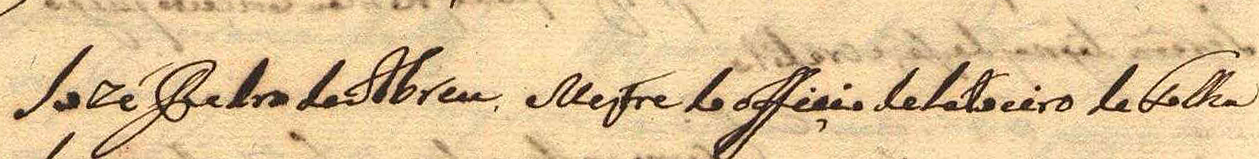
Iozé Pedro de Abreu, Mestre do officio de Iatoeiro de Folha
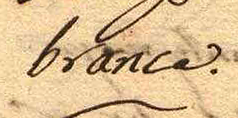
branca.
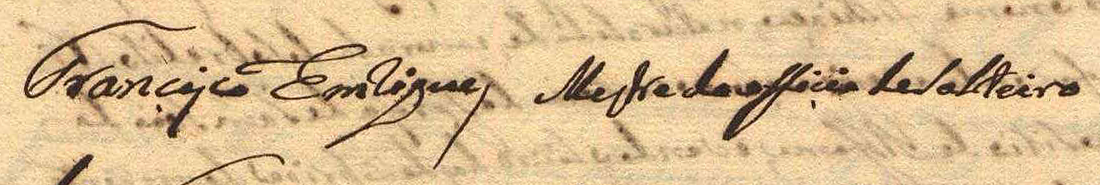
Francisco EmRiques Mestre do officio de Salteiro
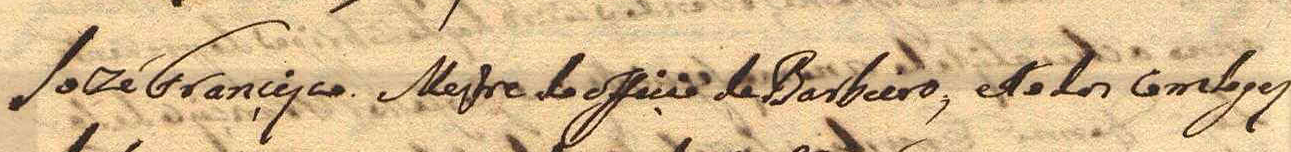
Iozé Francisco Mestre do officio de Barbeiro, e todos com loges
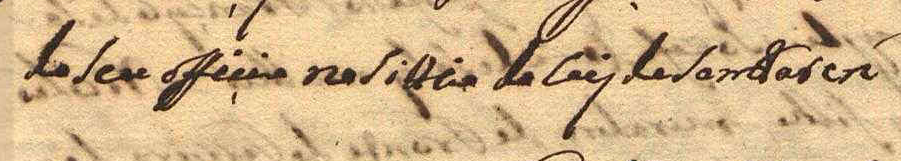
do seu officio no sittio do Ceis de Samtaren̄
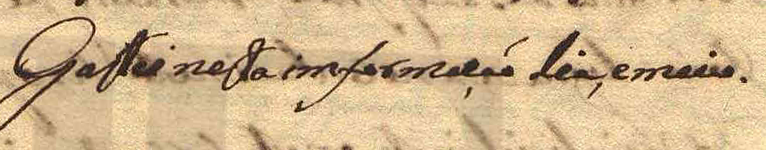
Gastei nesta imformaçaõ dia, e meio.
